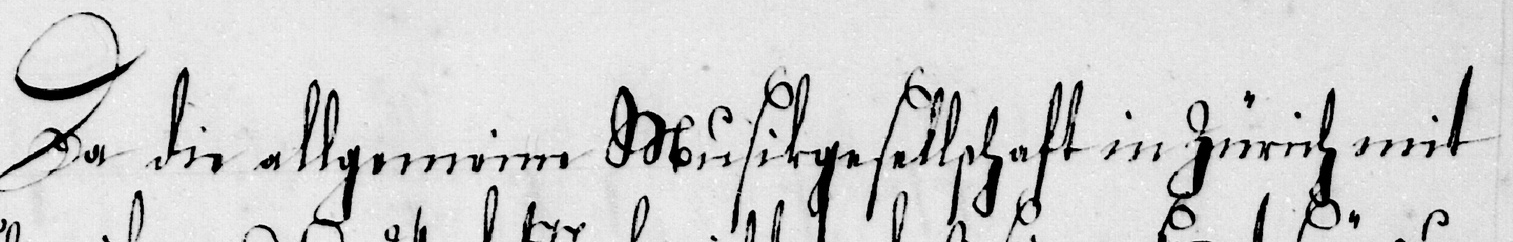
Da die allgemeine Musikgesellschaft in Zürich mit
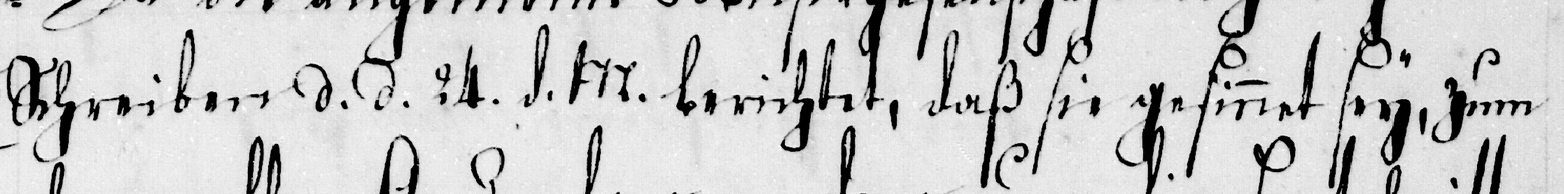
Schreiben d. d. 24. d. M. berichtet, daß sie gesinnet sey, zum
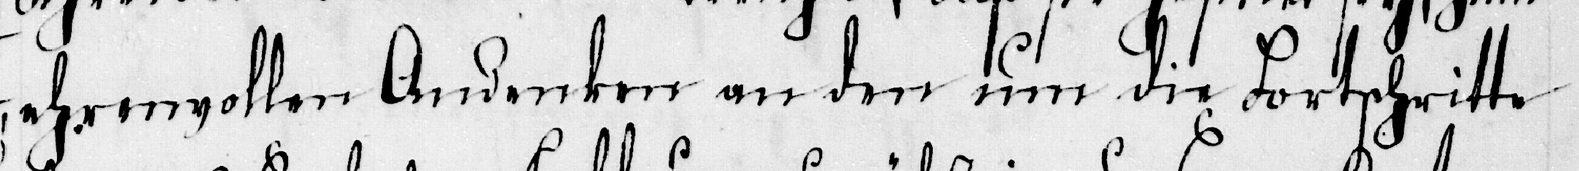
ehrenvollen Andenken an den um die Fortschritte
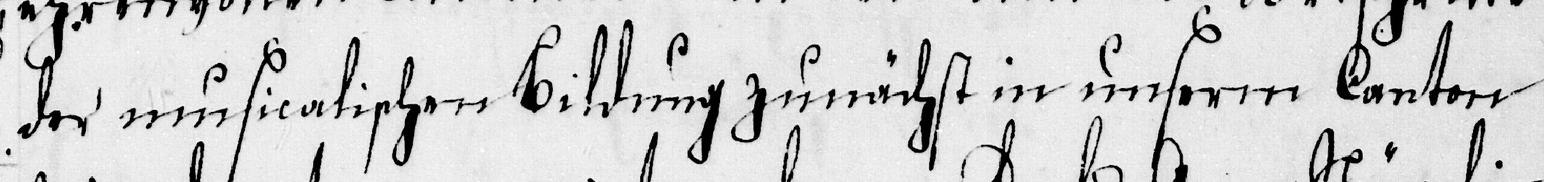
der musicalischen Bildung zunächst in unserm Canton
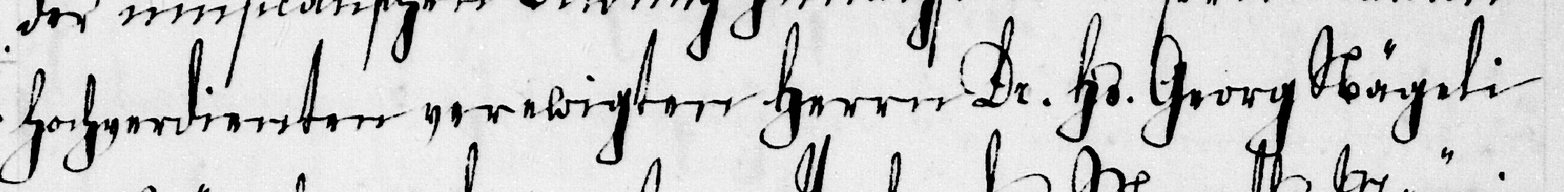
hochverdienten verewigten Herrn Dr. Hs. Georg Nägeli
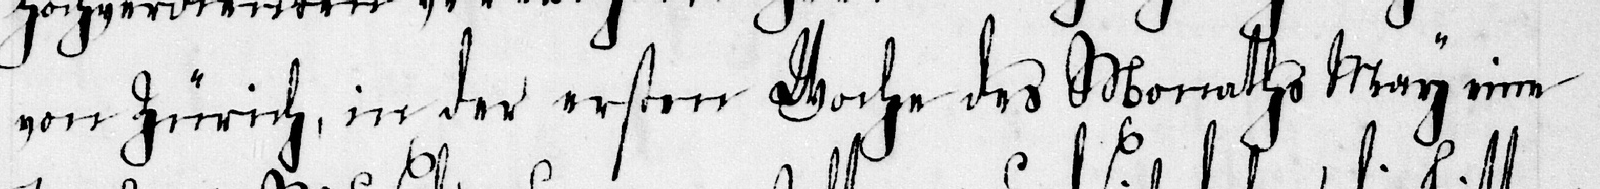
von Zürich, in der ersten Woche des Monaths März eine
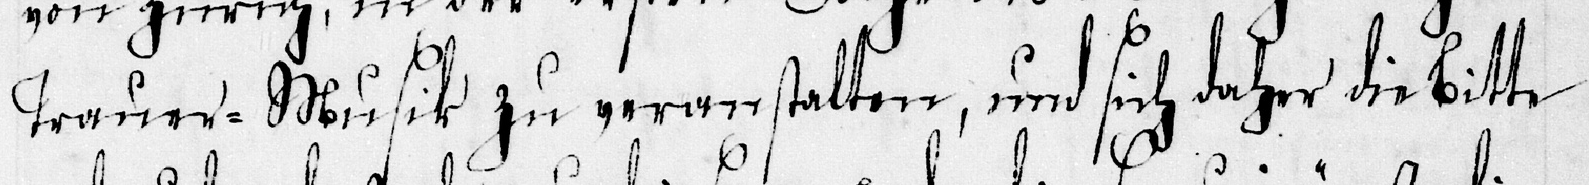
Trauer-Musik zu veranstalten, und sich daher die Bitte
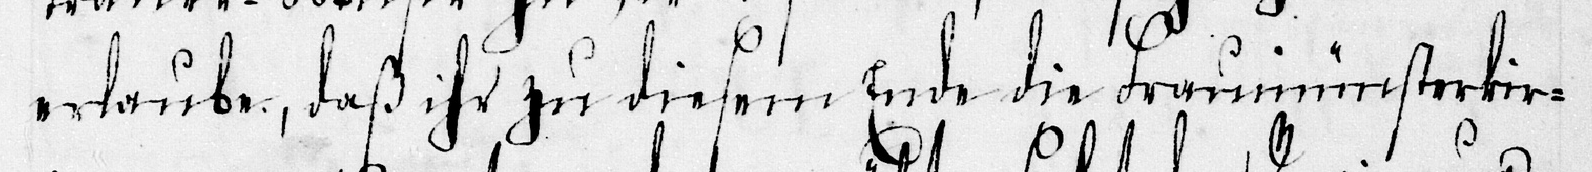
erlaube, daß ihr zu diesem Ende die Fraumünsterkir¬
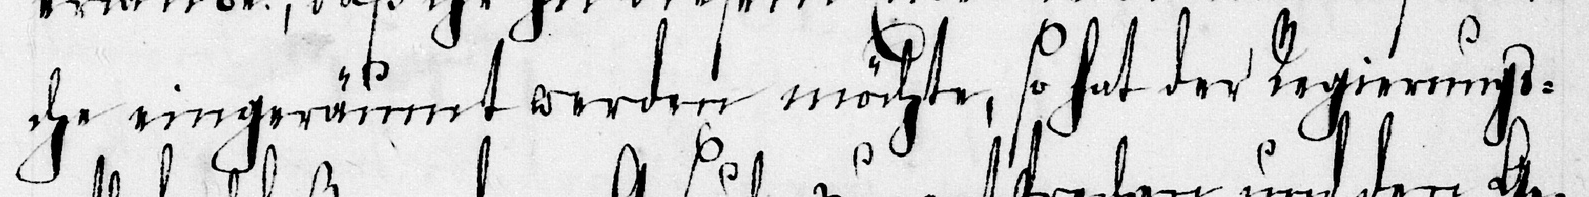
che eingeräumt werden möchte, so hat der Regierungs¬
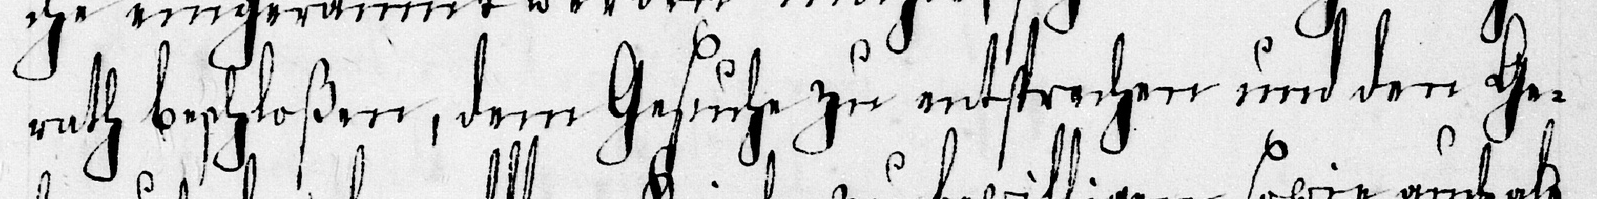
rath beschloßen, dem Gesuche zu entsprechen und den Ge¬
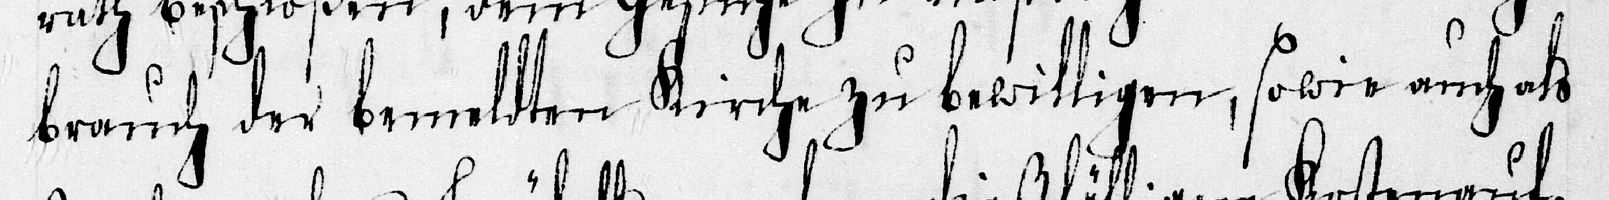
brauch der bemeldten Kirche zu bewilligen, sowie auch als
